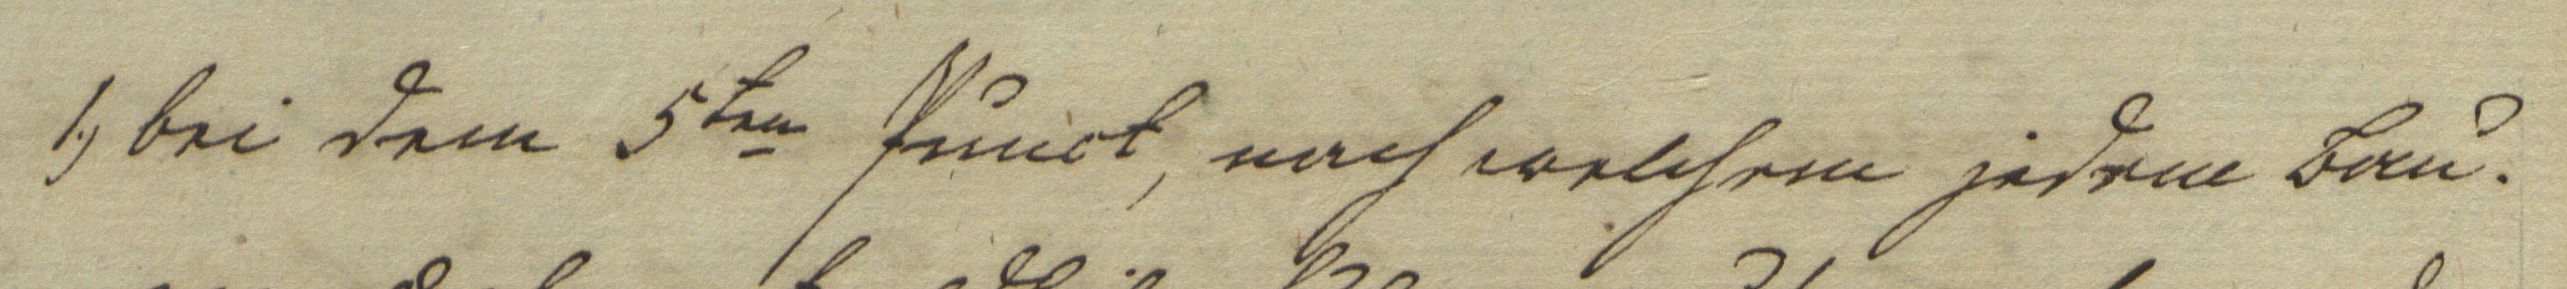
1., bei dem 5ten Punkct, nach welchem jedem Bau¬
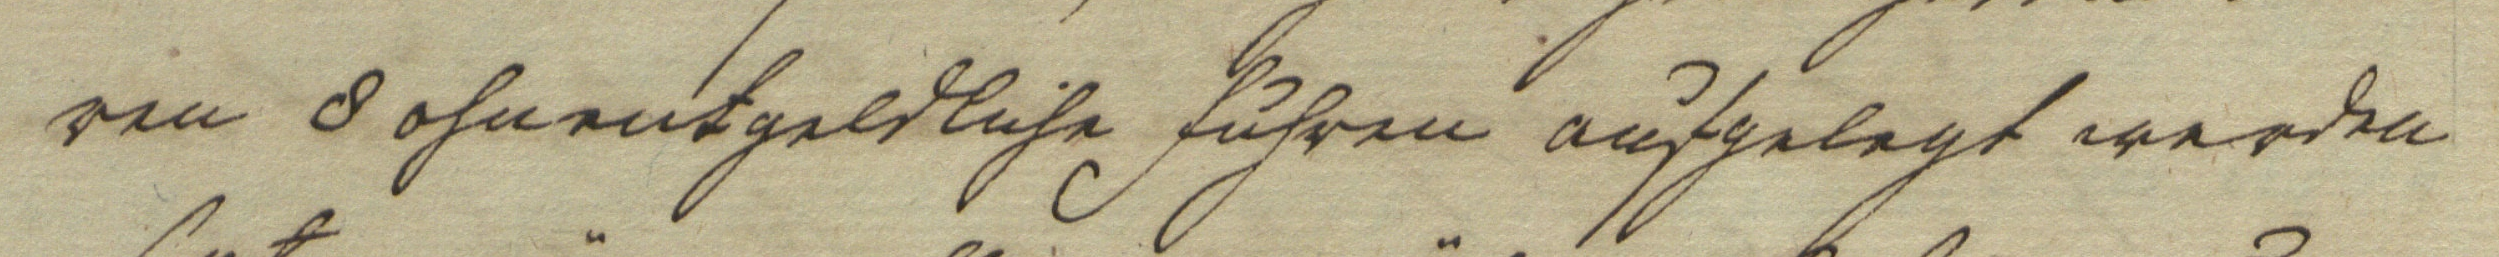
ren 8 ohnentgeldliche Fuhren aufgelegt werden
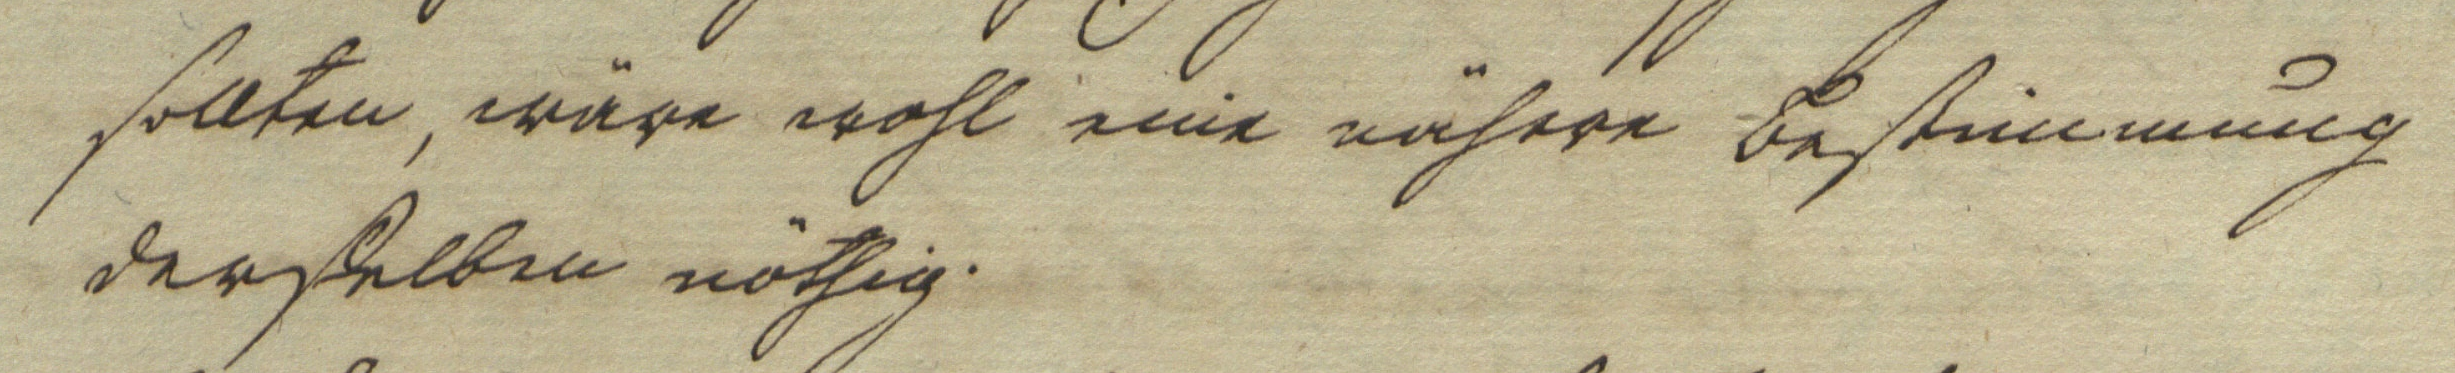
sollten, wäre wohl eine nähere Bestimmung
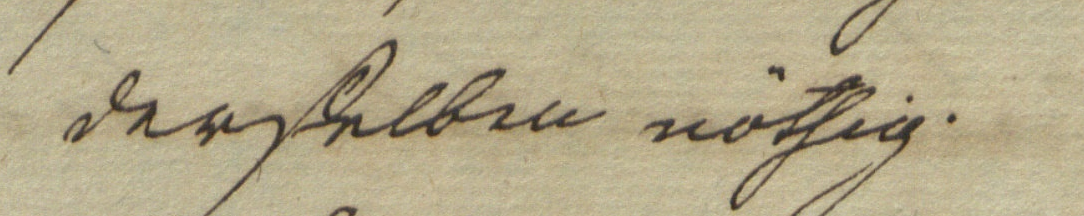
derselben nöthig.
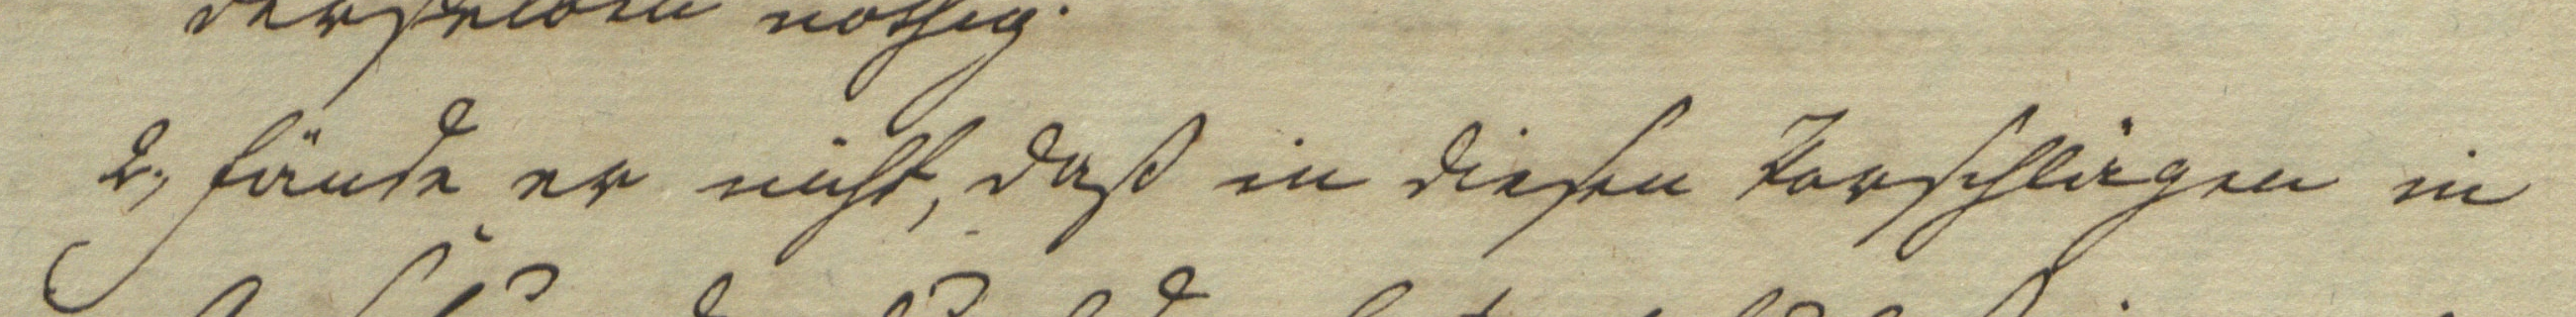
2., fände er nicht, daß in diesen Vorschlägen in
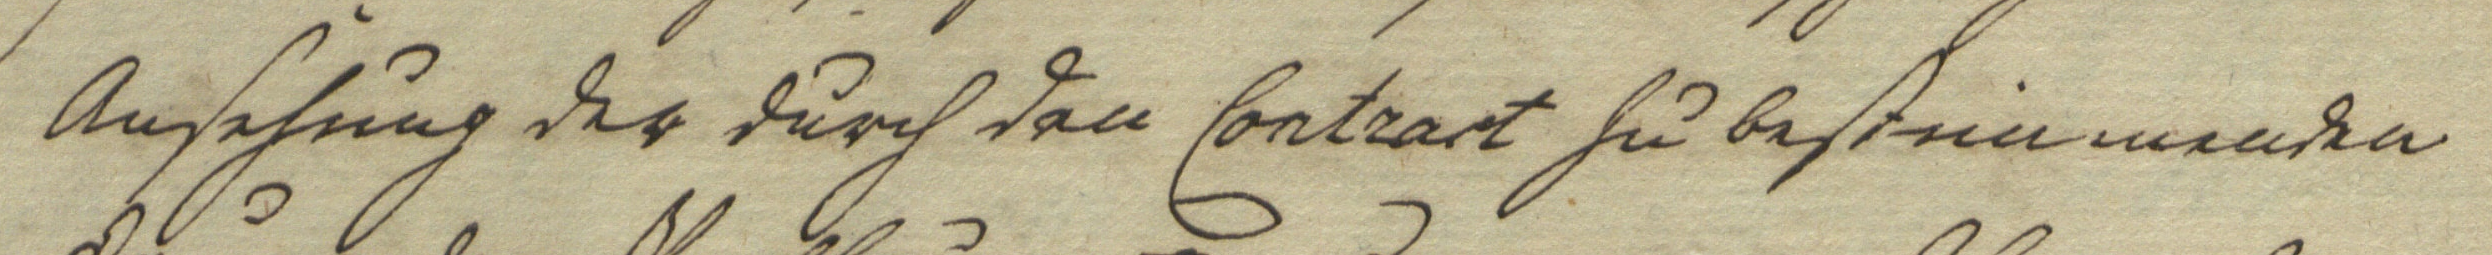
Ansehung der durch den Contract zu bestimmenden
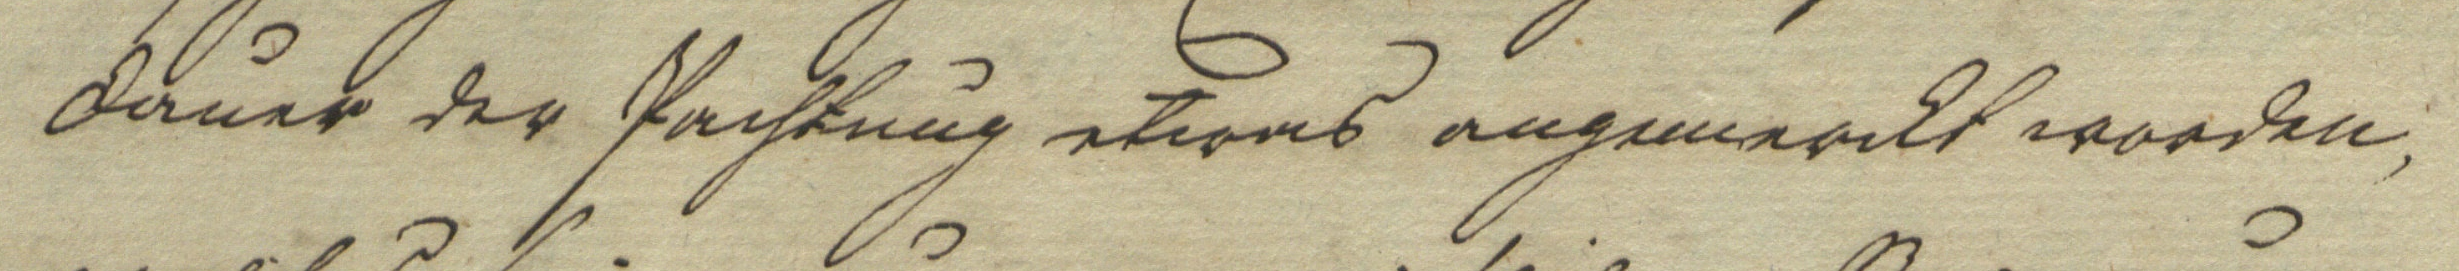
Dauer der Pachtung etwas angemerkt worden
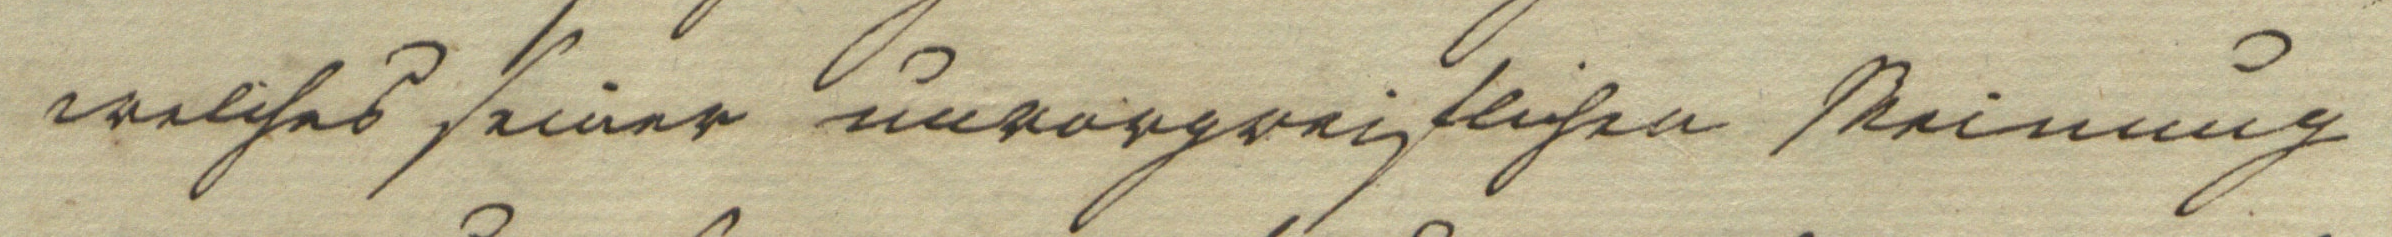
welches seiner unvorgreiflichen Meinung
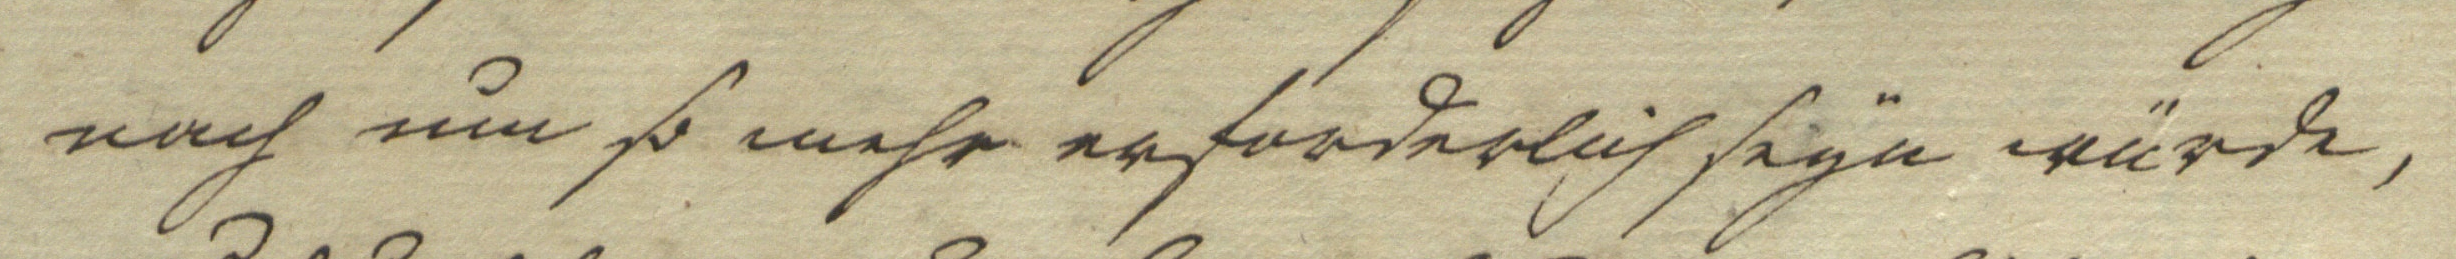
nach um so mehr erforderlich seyn würde,
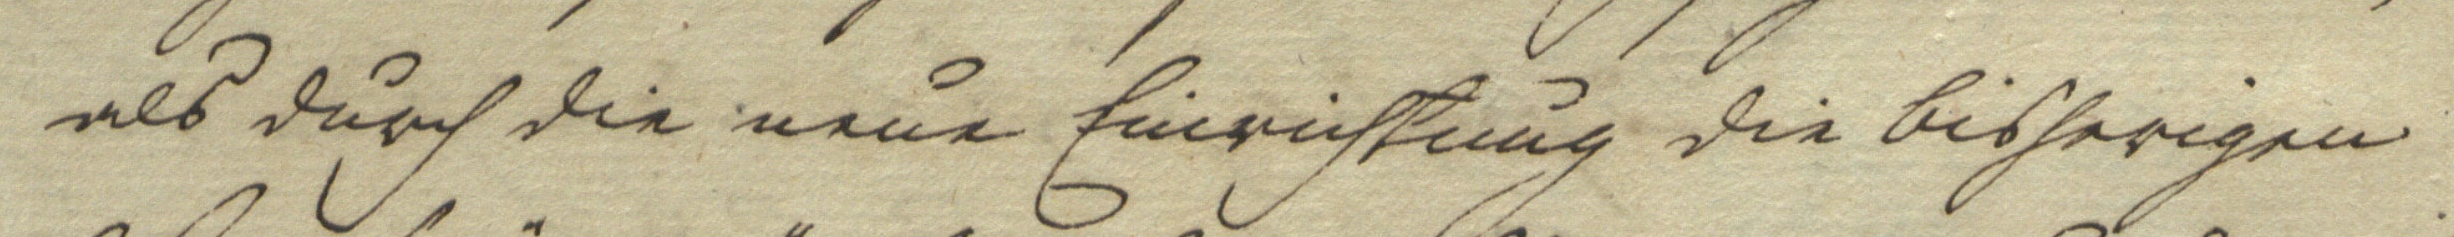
als durch die neue Einrichtung die bisheringen
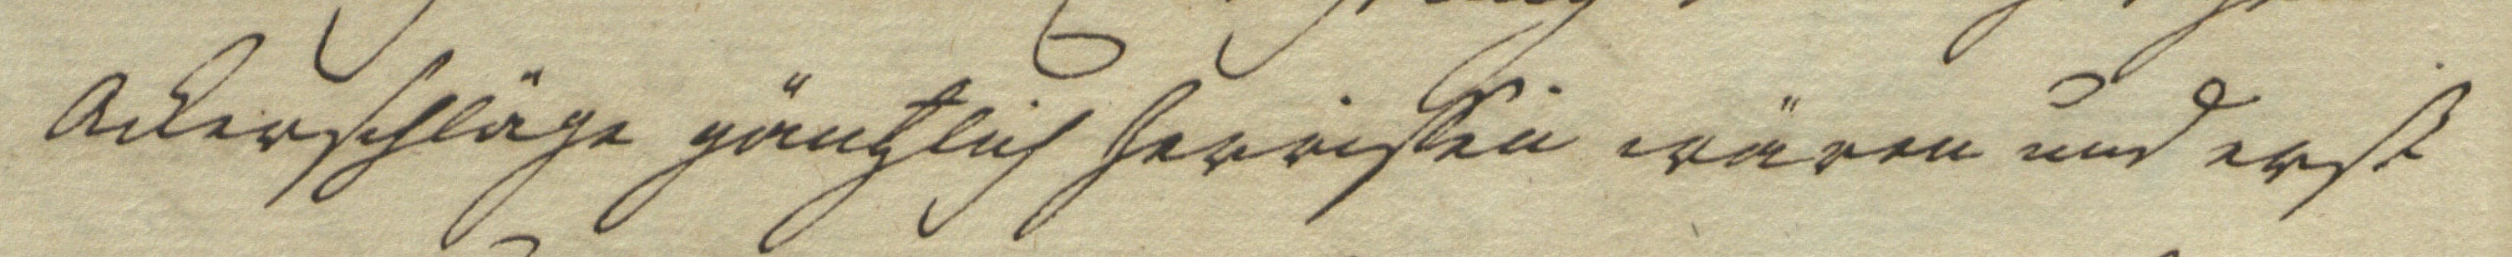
Ackerschläge gäntzlich zerrissen wären und erst
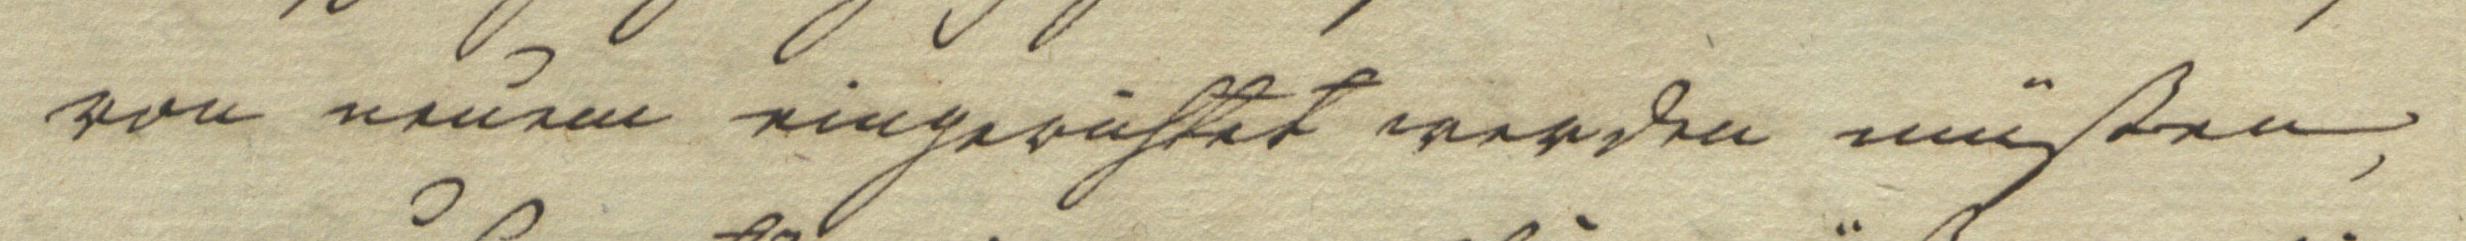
von neuem eingerichtet werden müßten,
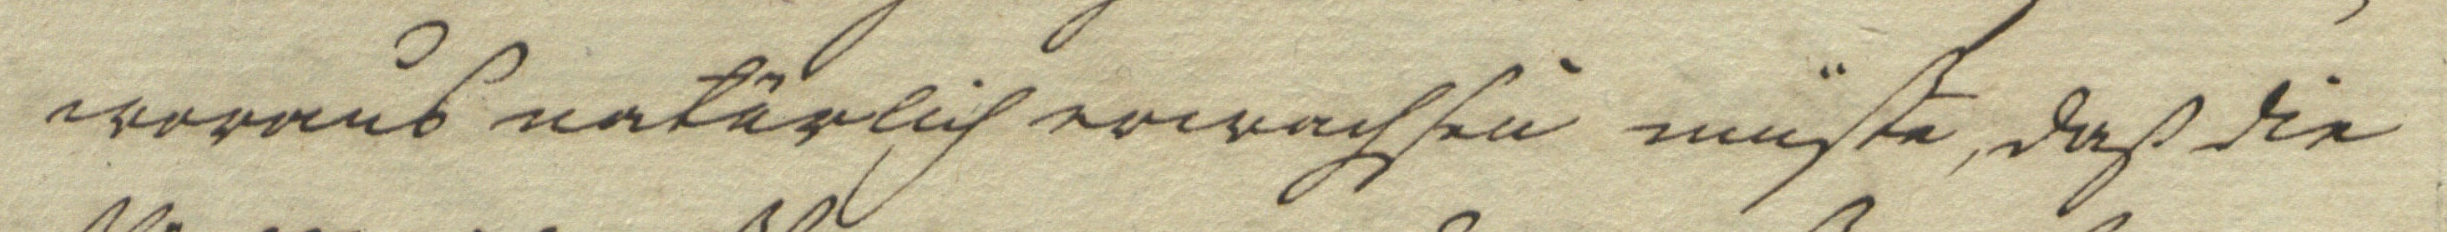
woraus natürlich erwachsen müßte, daß die
